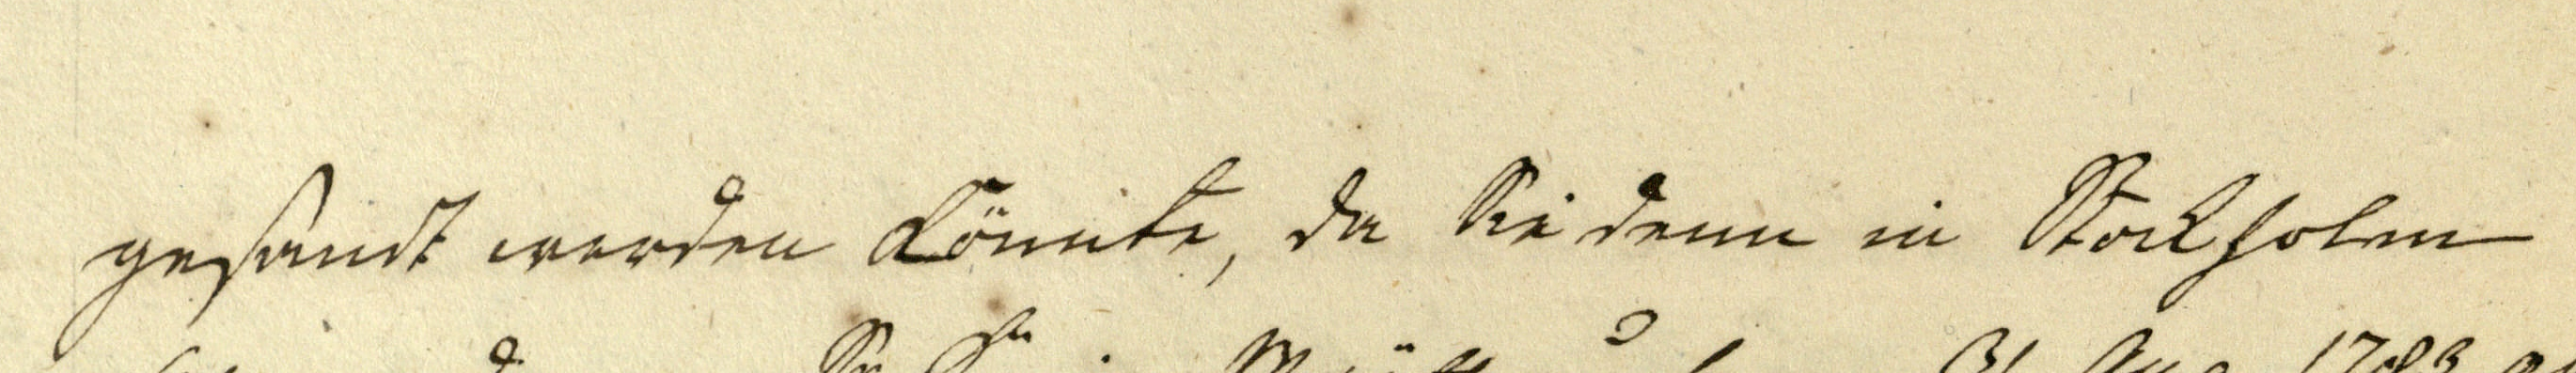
gesandt werden könnte, da Sie denn in Stockholm
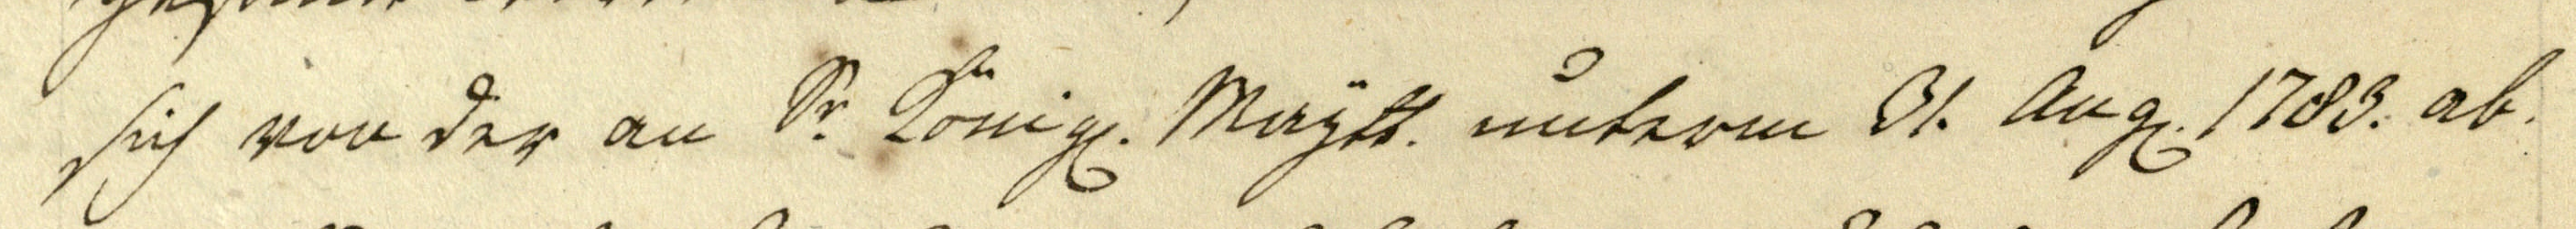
sich von der an Sr. Königl. Maÿtt. unterm 31. Aug. 1783. ab¬
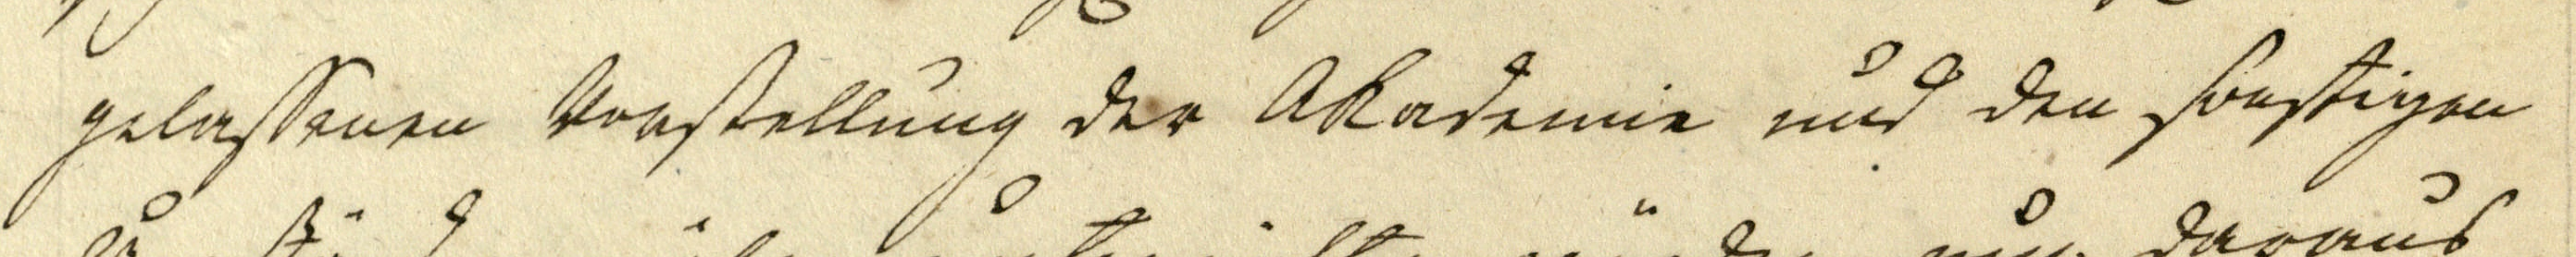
gelassenen Vorstellung der Akademie und den sonstigen
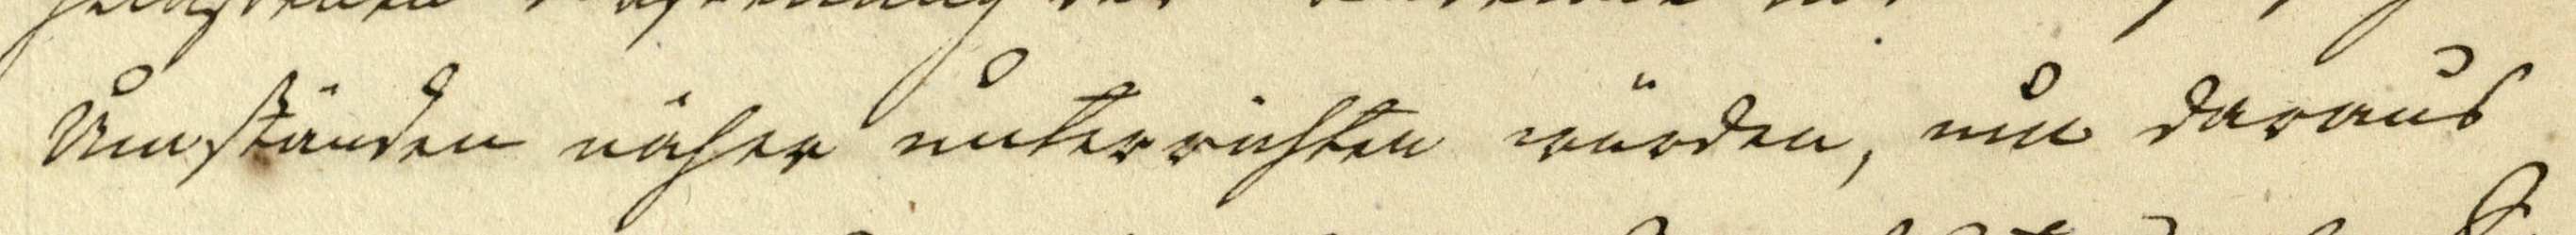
Umständen näher unterrichten würden, um daraus
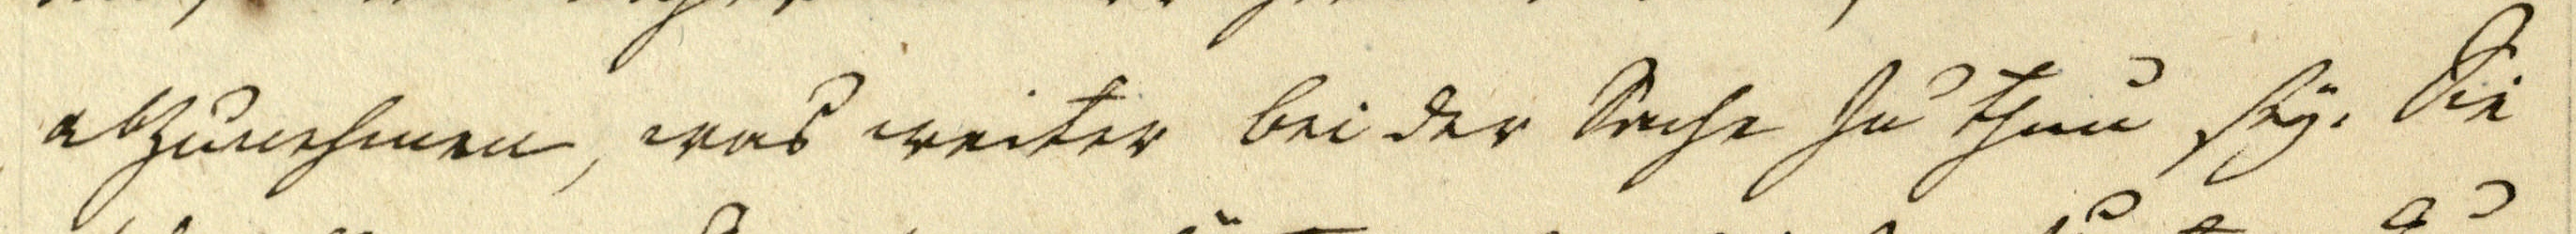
abzunehmen, was weiter bei der Sache zu thun seÿ. Sie
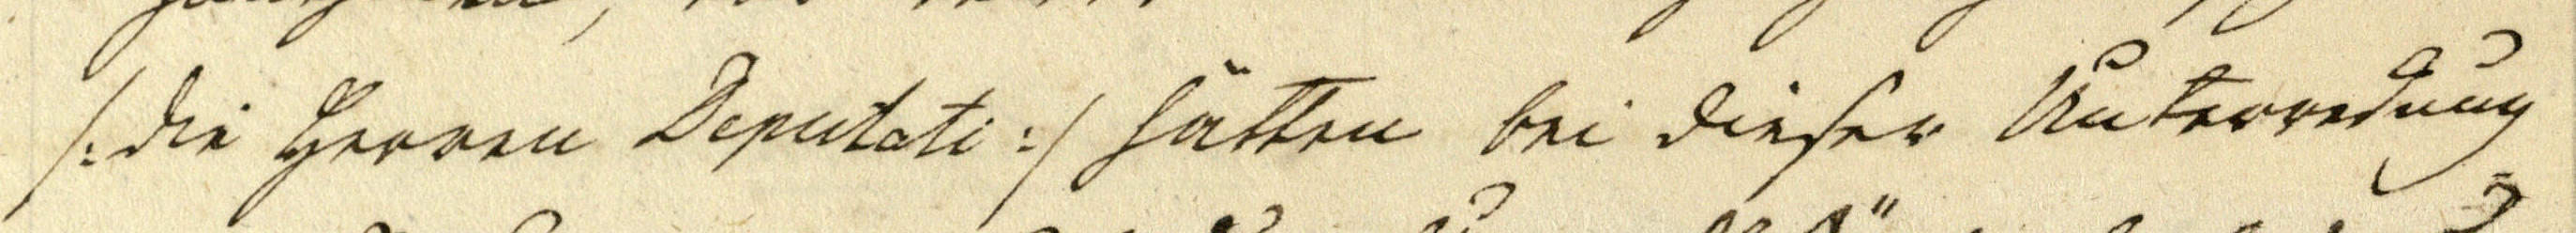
/ die Herren Deputati / hätten bei dieser Unterredung
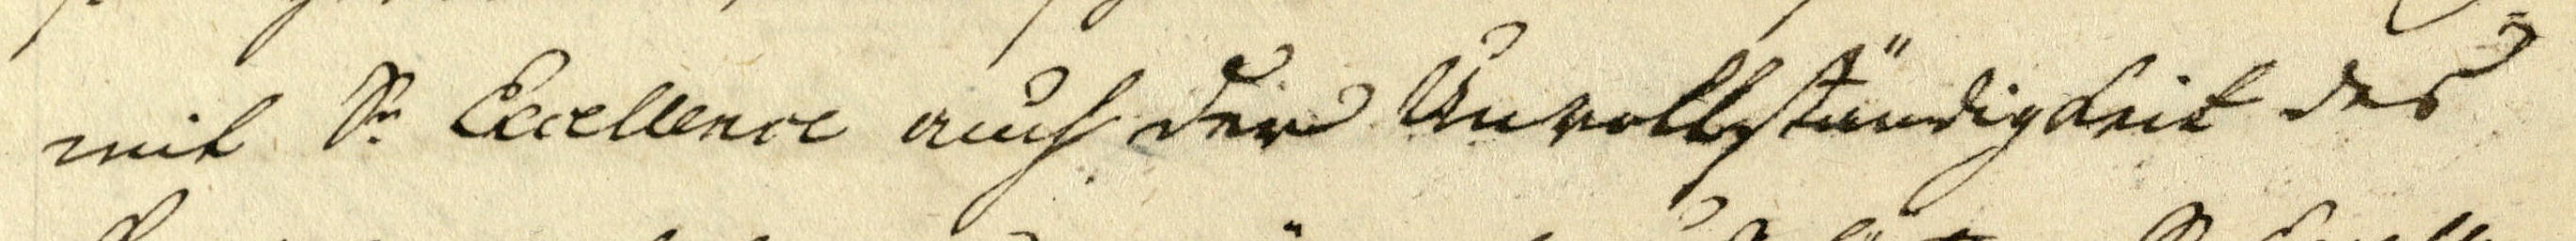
mit Sr. Excellence auch der Unvollständigkeit des
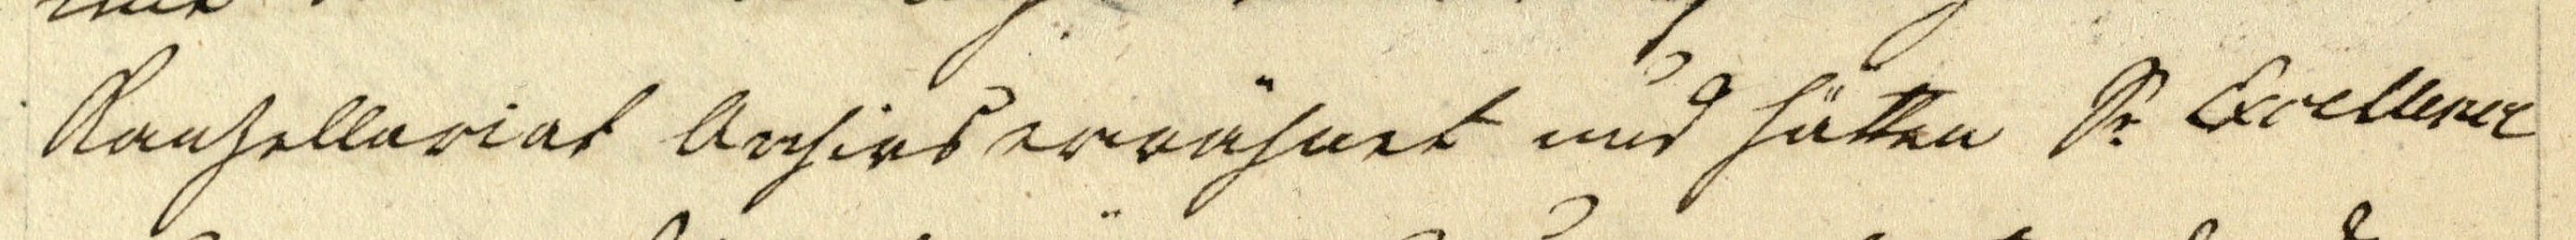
Kanzellariat Archivs erwähnet und hätten Sr. Excellence
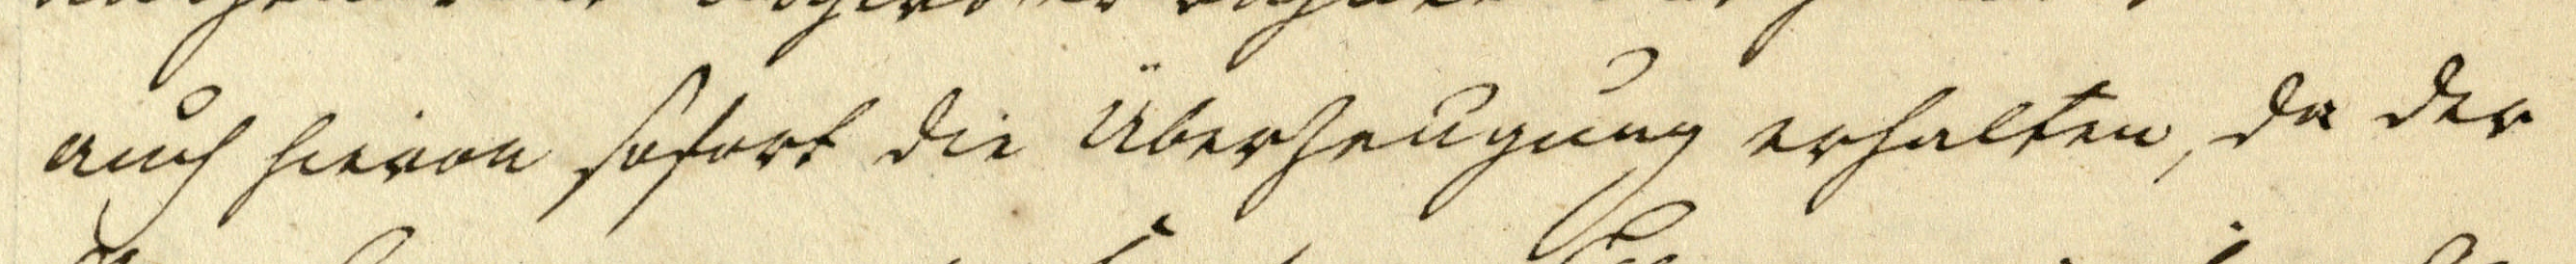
auch hievon sofort die Überzeugung erhalten, da der
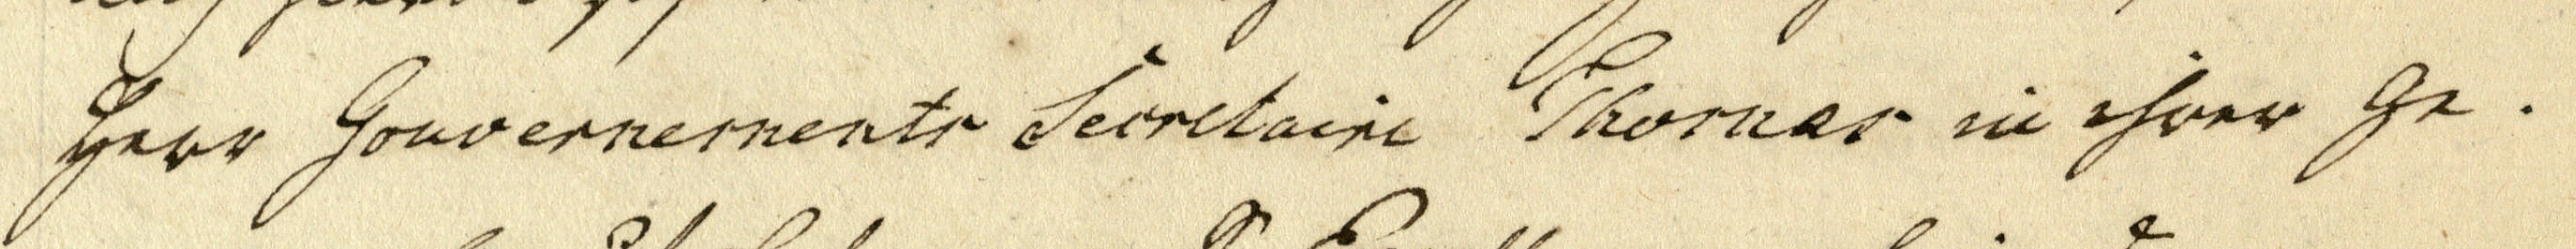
Herr Gouvernements Secretaire Thomas in ihrer Ge¬
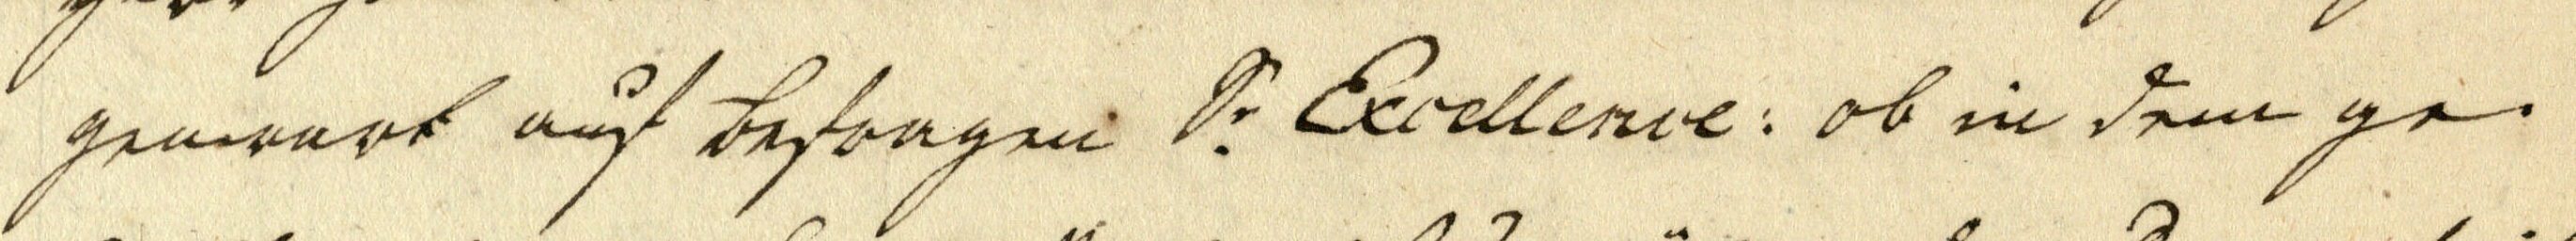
genwart auf Befragen Sr. Excellence: ob in dem ge¬
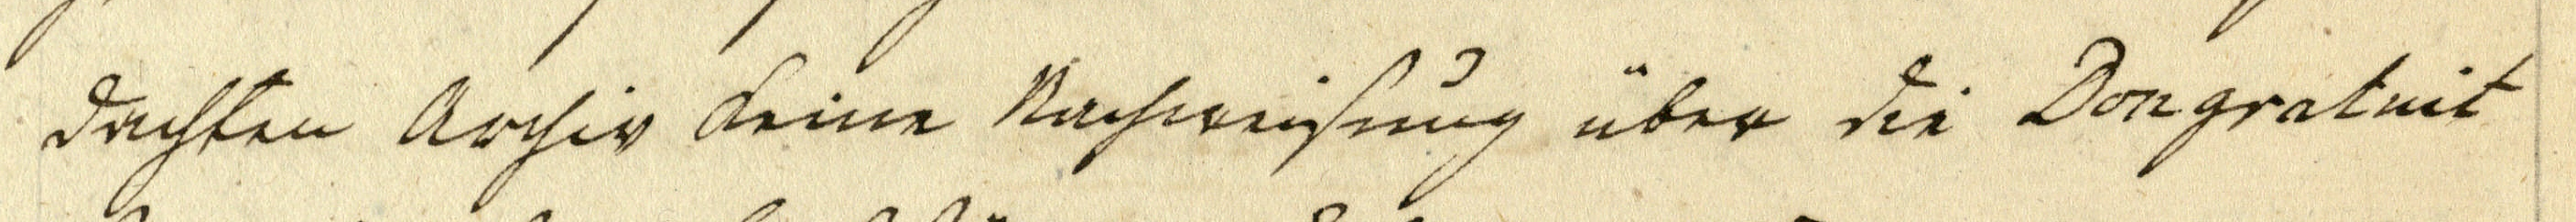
dachten Archiv keine Nachweisung über die Don gratuit
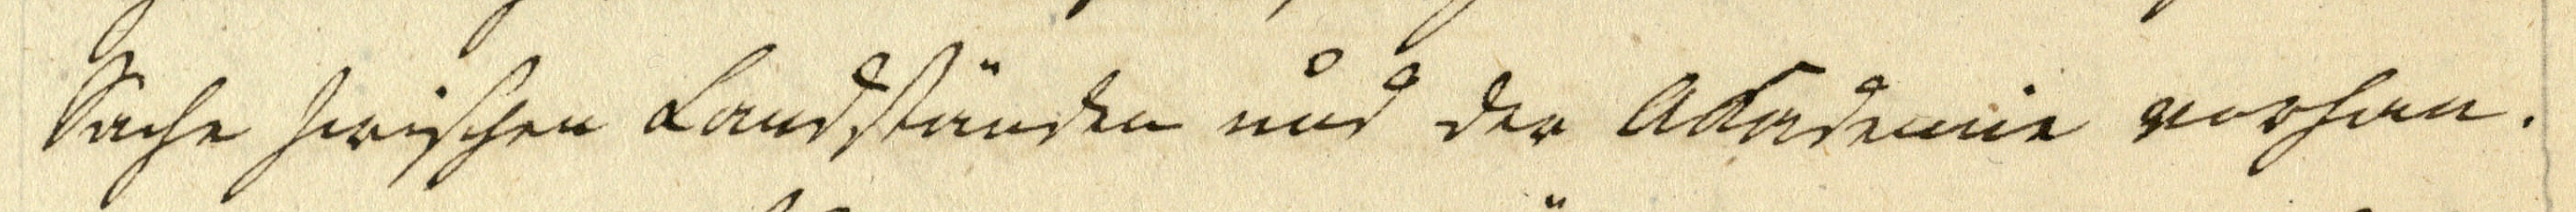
Sache zwischen Landständen und der Akademie vorhan¬
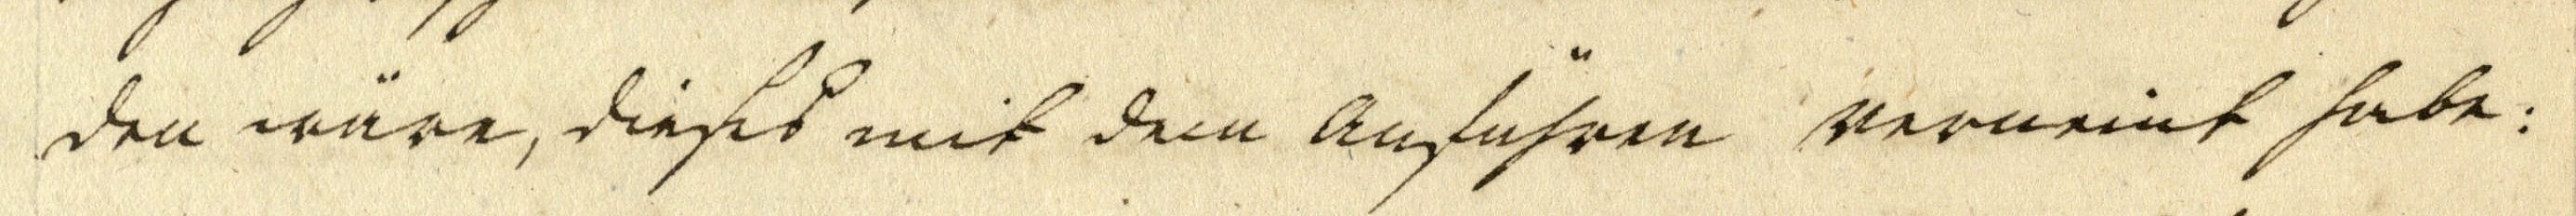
den wäre, dieses mit dem Anführen verneint habe:
